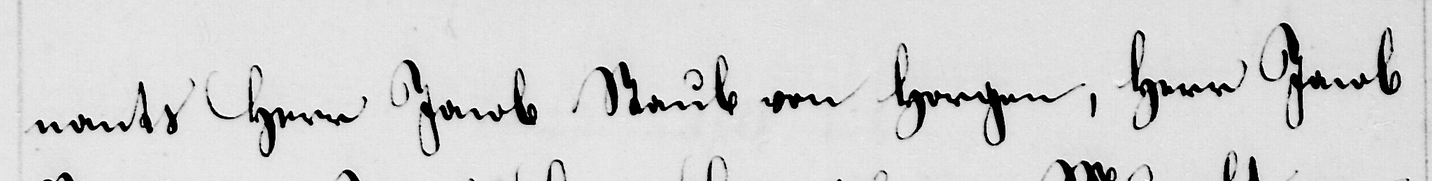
nants Herr Jacob Staub von Horgen, Herr Jacob
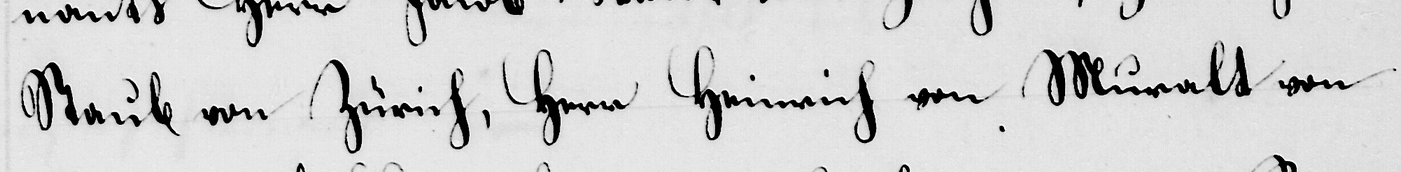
Staub von Zürich, Herr Heinrich von Muralt von
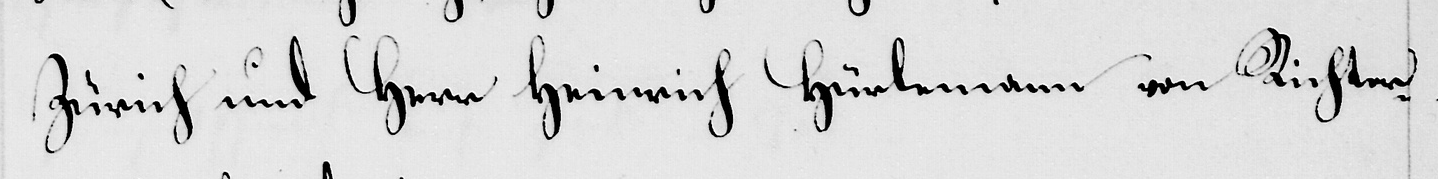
Zürich und Herr Heinrich Hürlemann von Richter¬
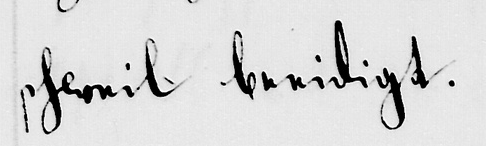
schweil beeidigt.
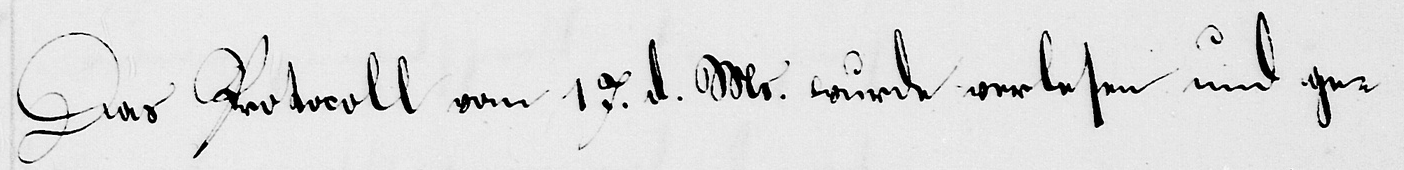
Das Protocoll vom 17. d. Ms. wurde verlesen und ge¬
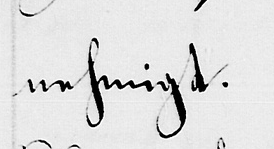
nehmigt.
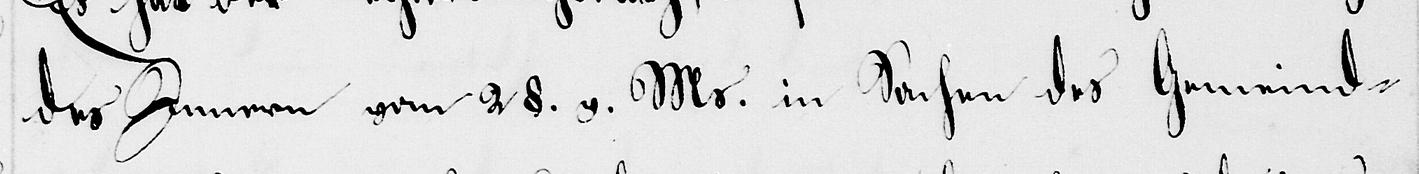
des Innern vom 28. v. Ms. in Sachen des Gemeind¬
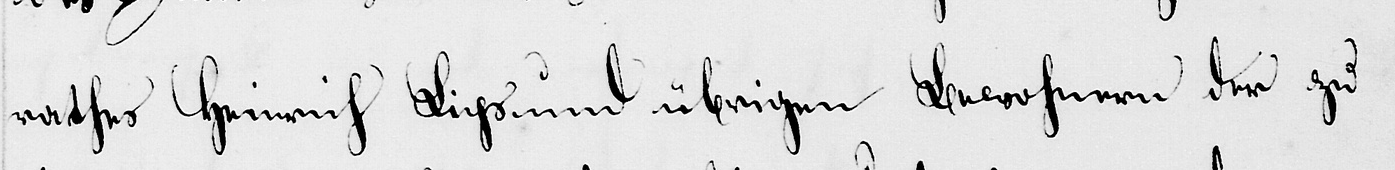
rathes Heinrich Lips und übrigen Bewohnern der zu
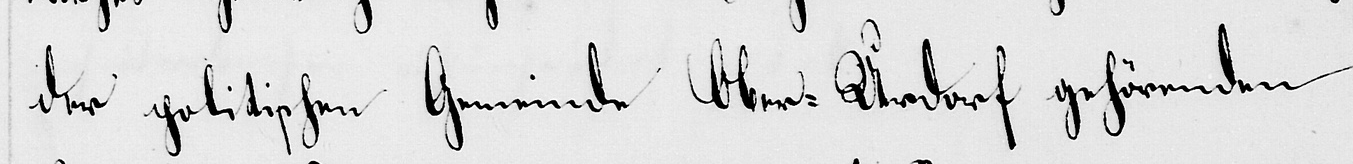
der politischen Gemeinde Ober-Urdorf gehörenden
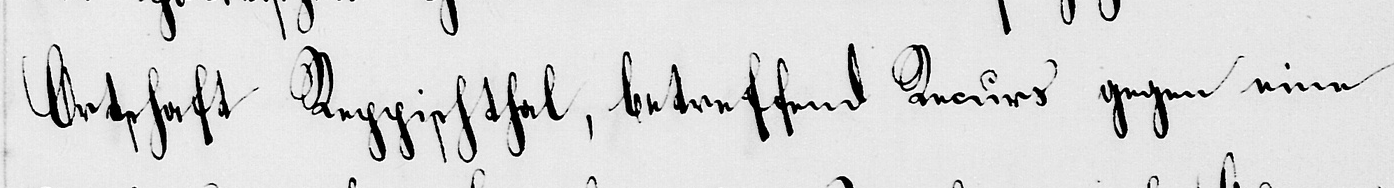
Ortschaft Reppischthal, betreffend Recurs gegen eine
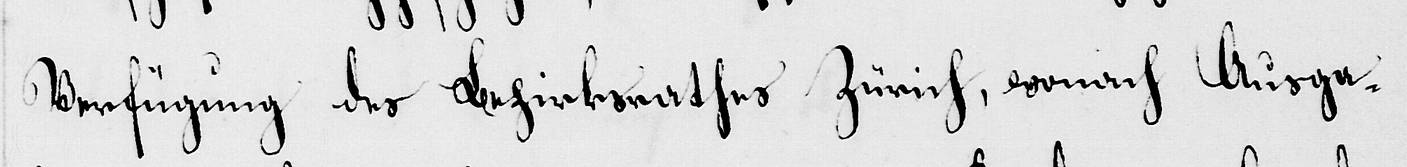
Verfügung des Bezirksrathes Zürich, wonach Ausga¬
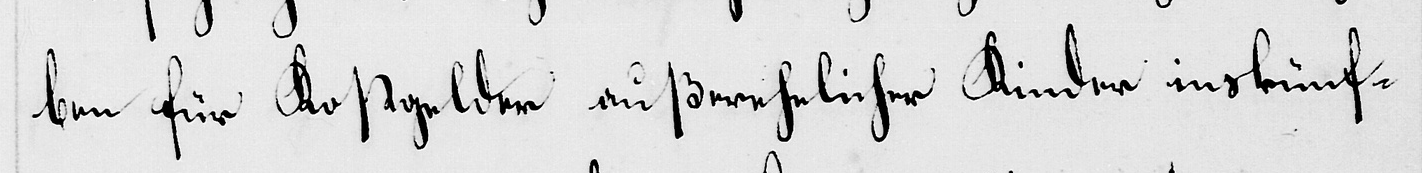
ben für Kostgelder außerehelicher Kinder inskünf¬
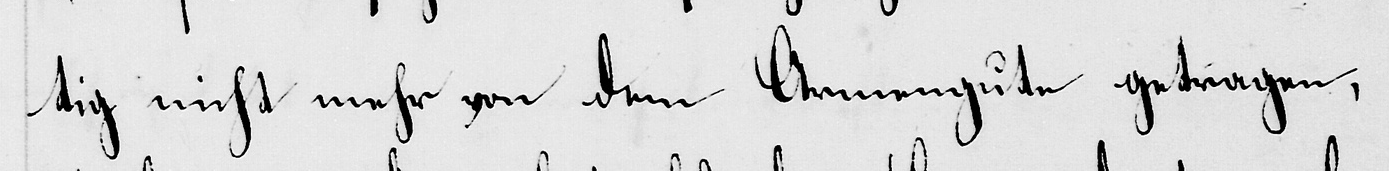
tig nicht mehr von dem Armengute getragen,
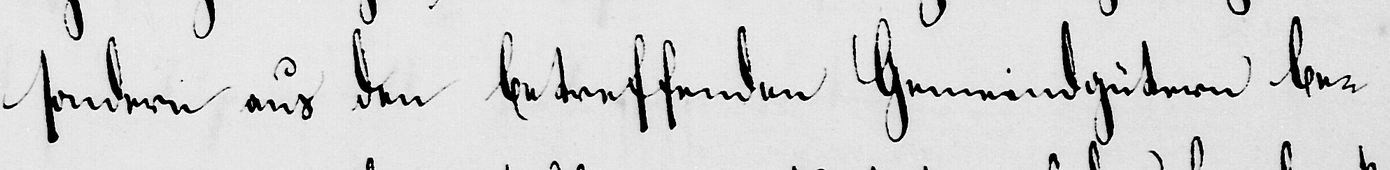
sondern aus den betreffenden Gemeindgütern be¬
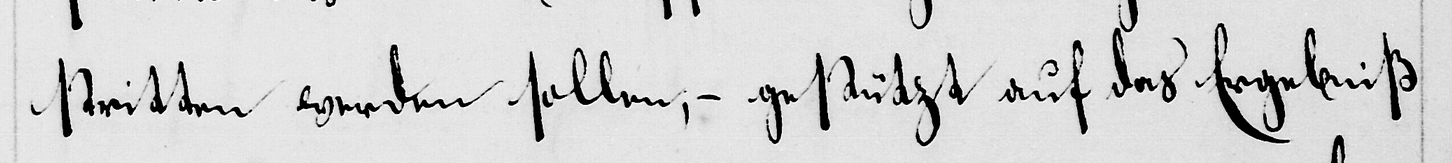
stritten werden sollen, – gestützt auf das Ergebniß
